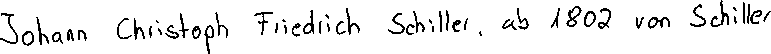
Johann Christoph Friedrich Schiller, ab 1802 von Schiller
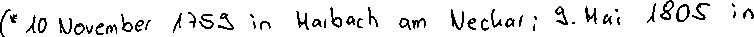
(* 10. November 1759 in Marbach am Neckar; 9. Mai 1805 in
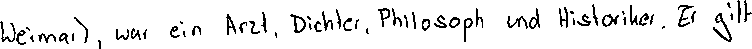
Weimar), war ein Arzt, Dichter, Philosoph und Historiker. Er gilt
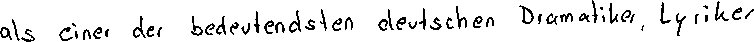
als einer der bedeutendsten deutschen Dramatiker, Lyriker
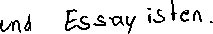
und Essayisten.
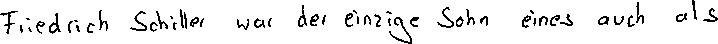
Friedrich Schiller war der einzige Sohn eines auch als
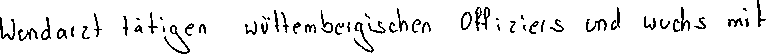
Wundarzt tätigen württembergischen Offiziers und wuchs mit
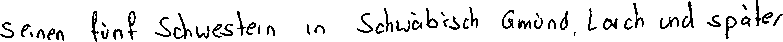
seinen fünf Schwestern in Schwäbisch Gmünd, Lorch und später
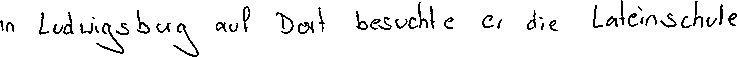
in Ludwigsburg auf. Dort besuchte er die Lateinschule
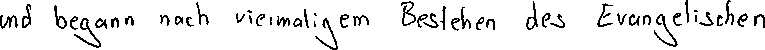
und begann nach viermaligem Bestehen des Evangelischen
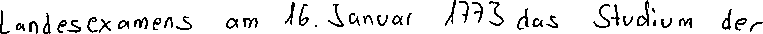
Landesexamens am 16. Januar 1773 das Studium der
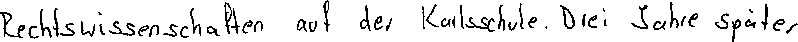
Rechtswissenschaften auf der Karlsschule. Drei Jahre später
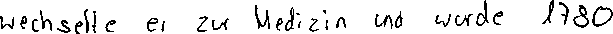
wechselte er zur Medizin und wurde 1780
